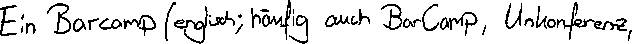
Ein Barcamp (englisch; häufig auch BarCamp, Unkonferenz,
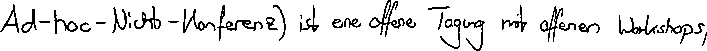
Ad-hoc-Nicht-Konferenz) ist eine offene Tagung mit offenen Workshops,
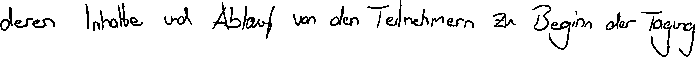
deren Inhalte und Ablauf von den Teilnehmern zu Beginn der Tagung
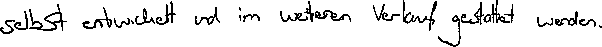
selbst entwickelt und im weiteren Verlauf gestaltet werden.
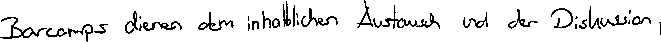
Barcamps dienen dem inhaltlichen Austausch und der Diskussion,
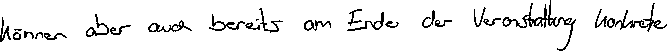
können aber auch bereits am Ende der Veranstaltung konkrete
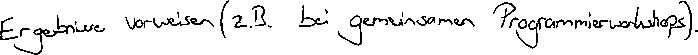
Ergebnisse vorweisen (z. B. bei gemeinsamen Programmierworkshops).
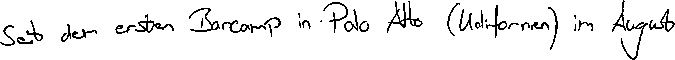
Seit dem ersten Barcamp in Palo Alto (Kalifornien) im August
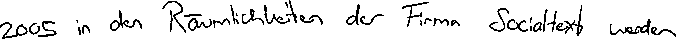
2005 in den Räumlichkeiten der Firma Socialtext werden
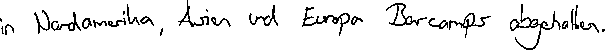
in Nordamerika, Asien und Europa Barcamps abgehalten.
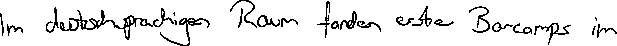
Im deutschsprachigen Raum fanden erste Barcamps im
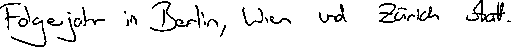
Folgejahr in Berlin, Wien und Zürich statt.
